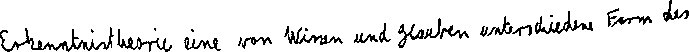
Erkenntnistheorie eine von Wissen und Glauben unterschiedene Form des
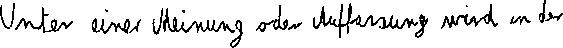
Unter einer Meinung oder Auffassung wird in der
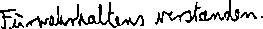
Fürwahrhaltens verstanden.
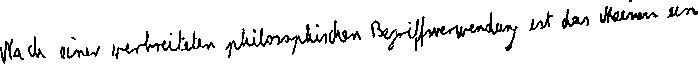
Nach einer verbreiteten philosophischen Begriffsverwendung ist das Meinen ein
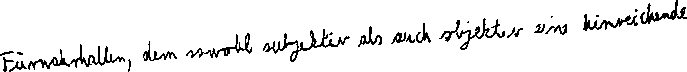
Fürwahrhalten, dem sowohl subjektiv als auch objektiv eine hinreichende
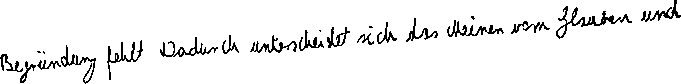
Begründung fehlt. Dadurch unterscheidet sich das Meinen vom Glauben und
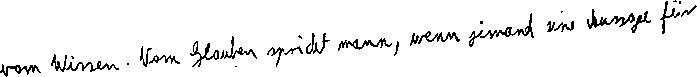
vom Wissen. Von Glauben spricht man, wenn jemand eine Aussage für
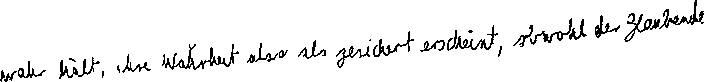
wahr hält, ihre Wahrheit also subjektiv als gesichert erscheint, obwohl der Glaubende
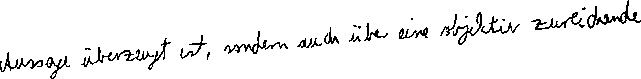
Aussage überzeugt ist, sondern auch über eine objektiv zureichende
